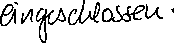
eingeschlossen.
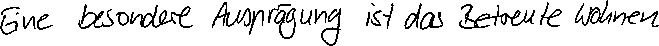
Eine besondere Ausprägung ist das Betreute Wohnen
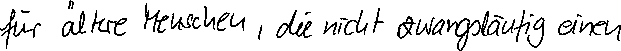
für ältere Menschen, die nicht zwangsläufig einen
